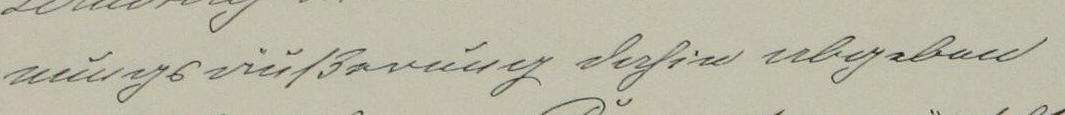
nungsäußerung dahin abgeben
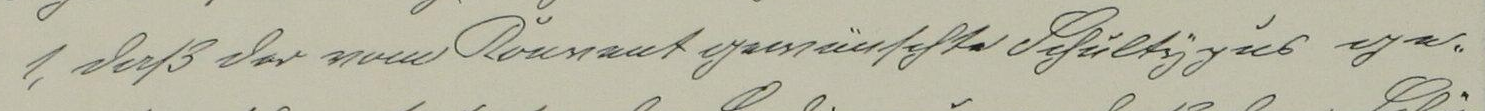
1. daß der vom Konvent gewünschte Schultypus ge-
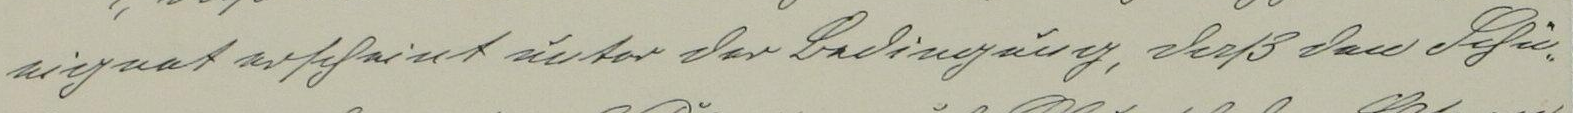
eignet erscheint unter der Bedingung, daß den Schü-
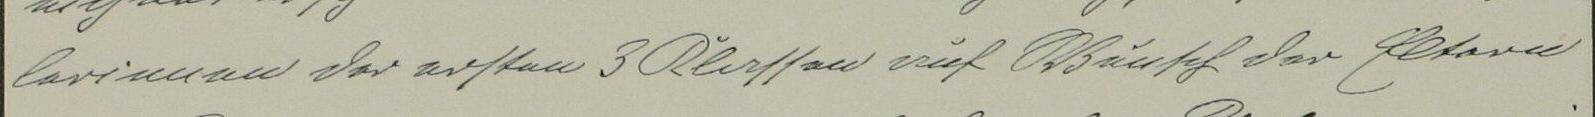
lerinnen der ersten 3 Klassen auf Wunsch der Eltern
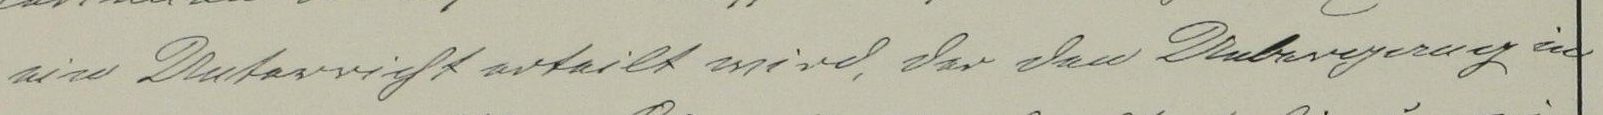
ein Unterricht erteilt wird, der den Uebergang in
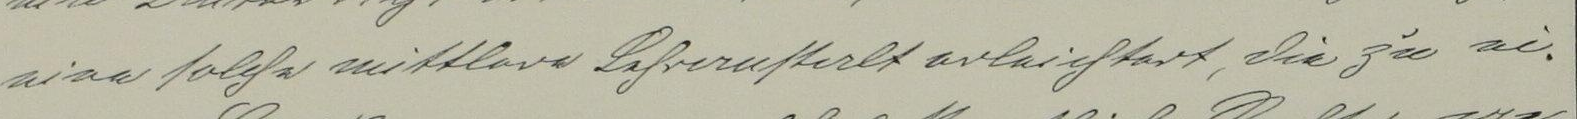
eine solche mittlere Lehranstalt erleichtert, die zu ei-
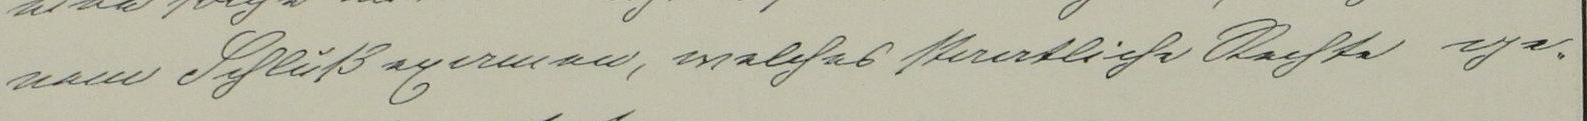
nem Schlußexamen, welches staatliche Rechte ge-
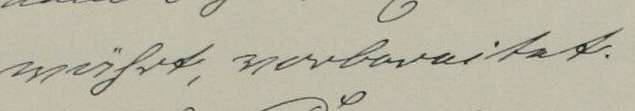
währt, vorbereitet.
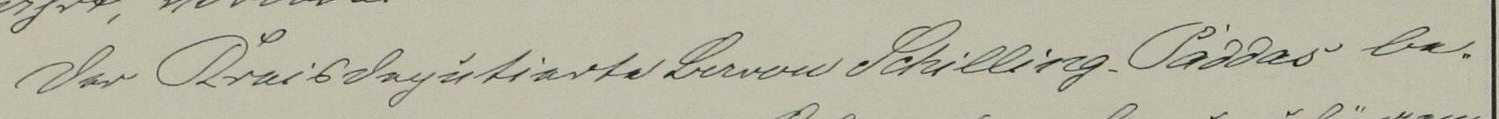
Der Kreisdeputierte Baron Schilling-Paddas be-
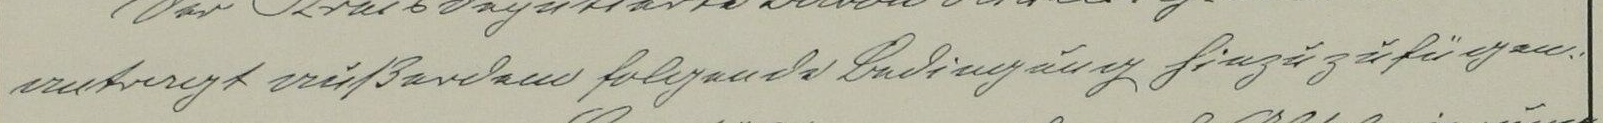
antragt außerdem, folgende Bedingung hinzuzufügen:
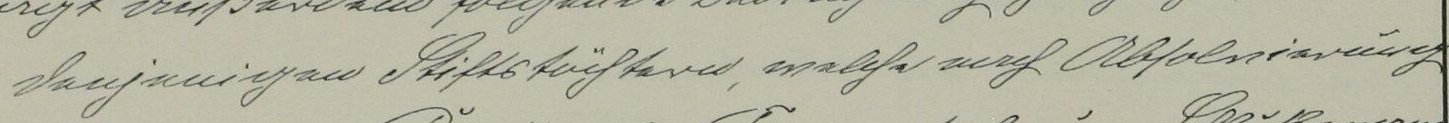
denjenigen Stiftstöchtern, welche nach Absolvierung
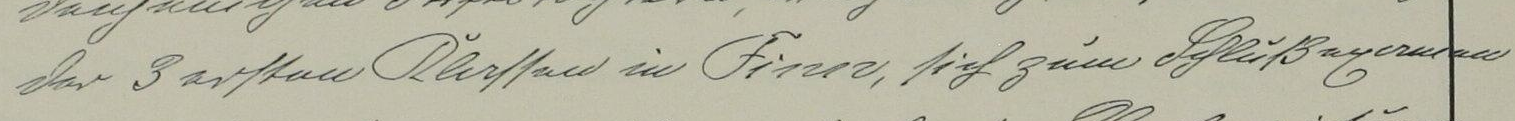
der 3 ersten Klassen in Finn, sich zum Schlußexamen
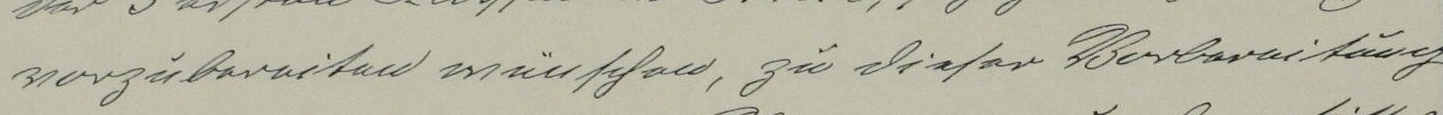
vorzubereiten wünschen, zu dieser Vorbereitung
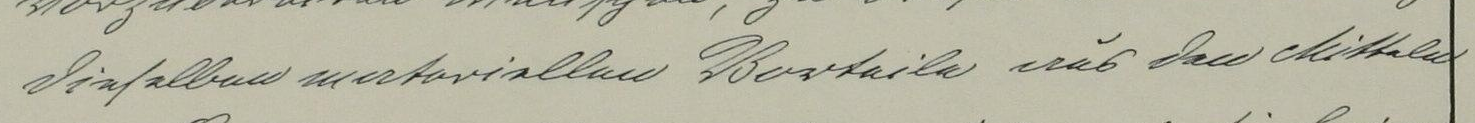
dieselben materiellen Vorteile aus den Mitteln
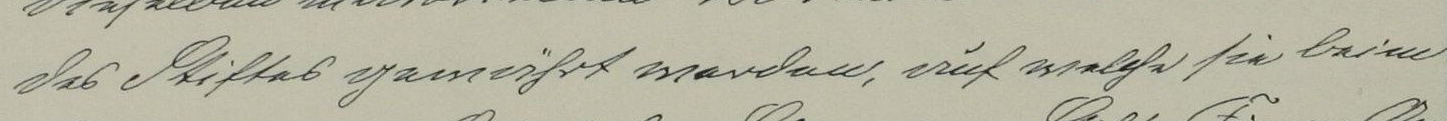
des Stiftes gewährt werden, auf welche sie beim
